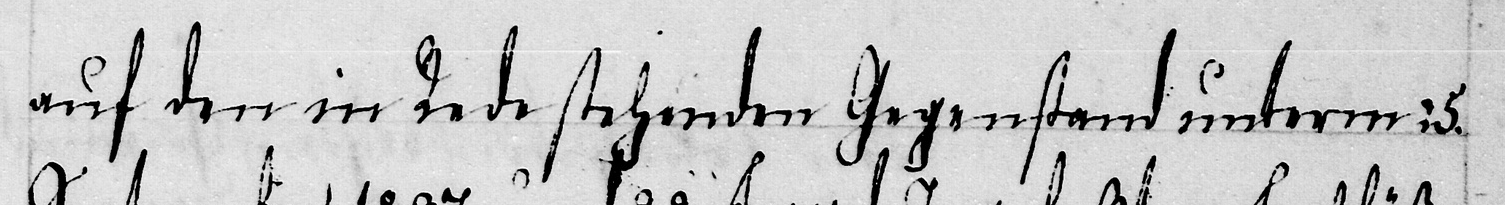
auf den in Rede stehenden Gegenstand unterm 25.
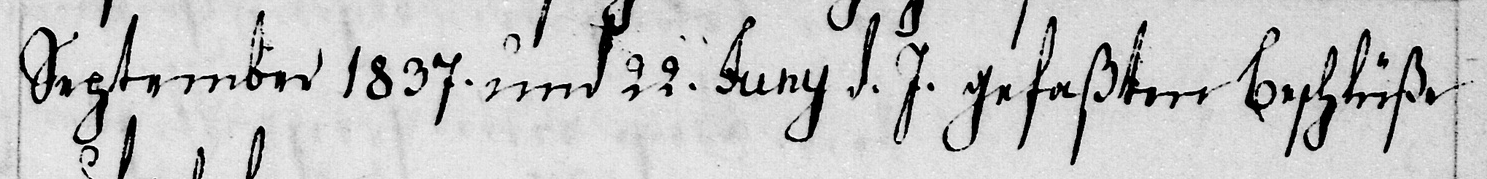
September 1837. und 22. Juny d. J. gefaßten Beschlüße
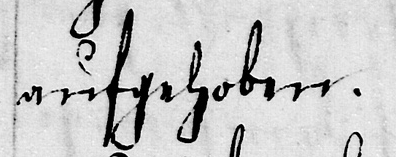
aufgehoben.
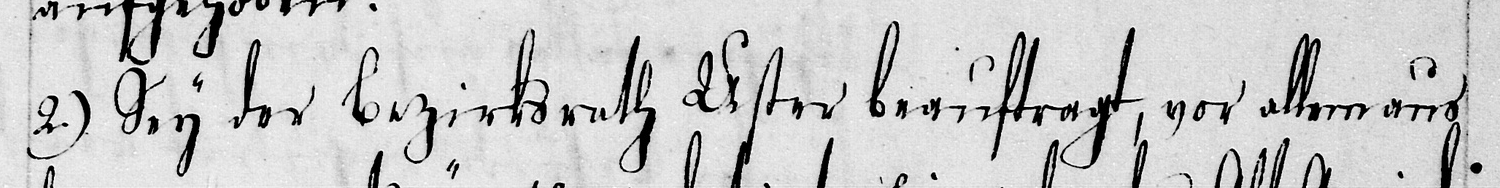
2.) Sey der Bezirksrath Uster beauftragt, vor allem aus
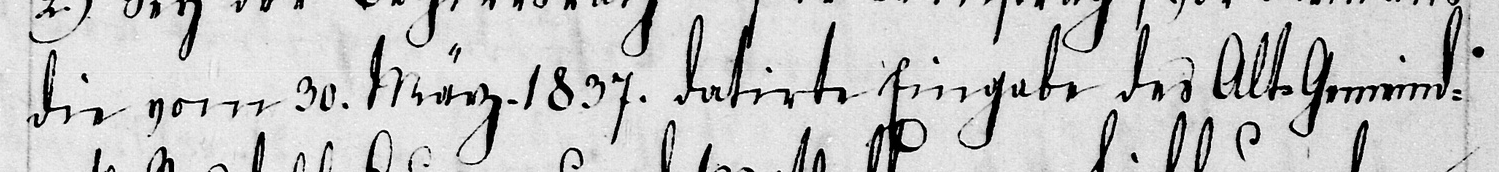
die vom 30. März 1837. datirte Eingabe des Alt-Gemeind¬
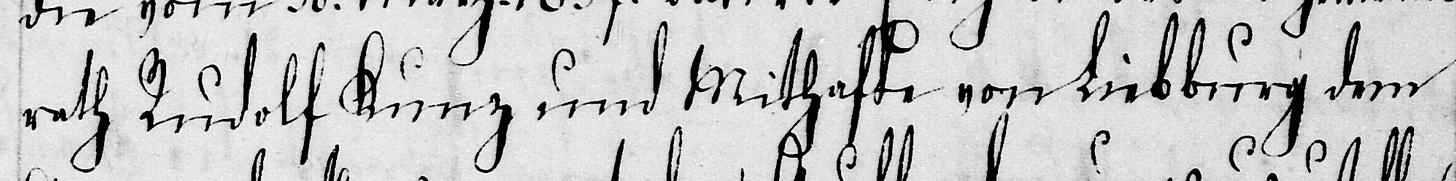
rath Rudolf Kunz und Mithafte von Liebburg dem
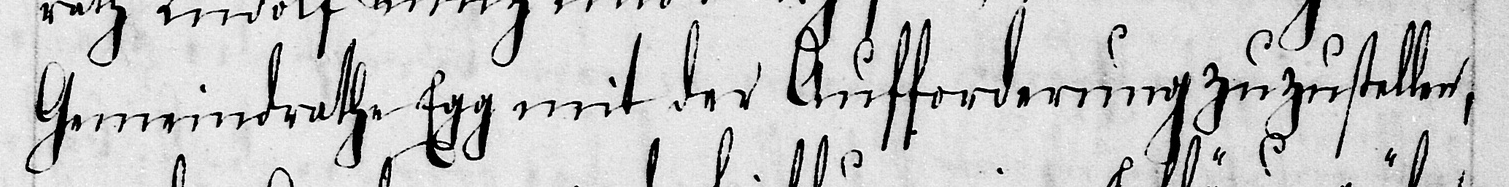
Gemeindrathe Egg mit der Aufforderung zuzustellen,
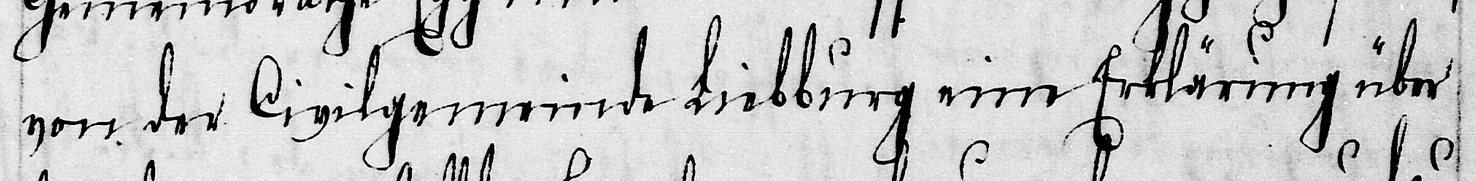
von der Civilgemeinde Liebburg eine Erklärung über
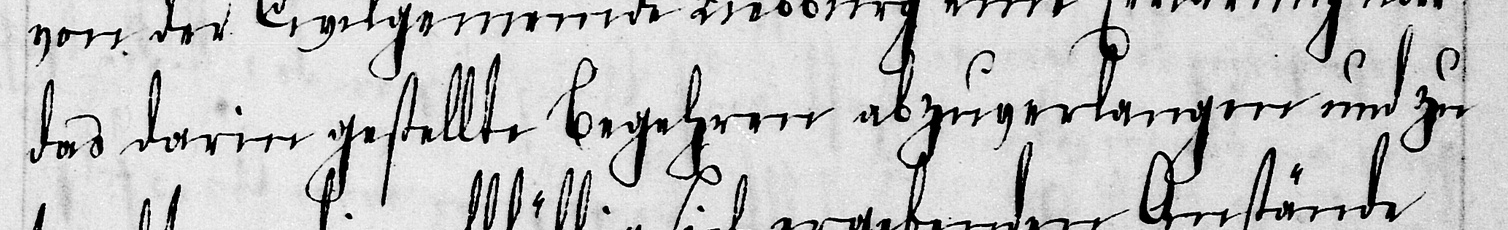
das darin gestellte Begehren abzuverlangen und zu
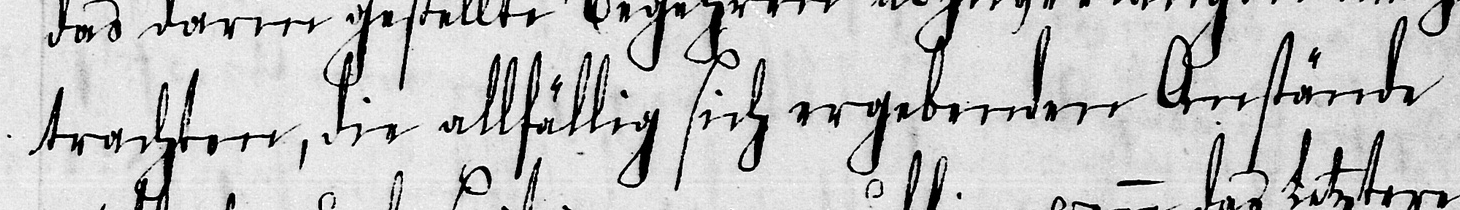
trachten, die allfällig sich ergebenden Anstände
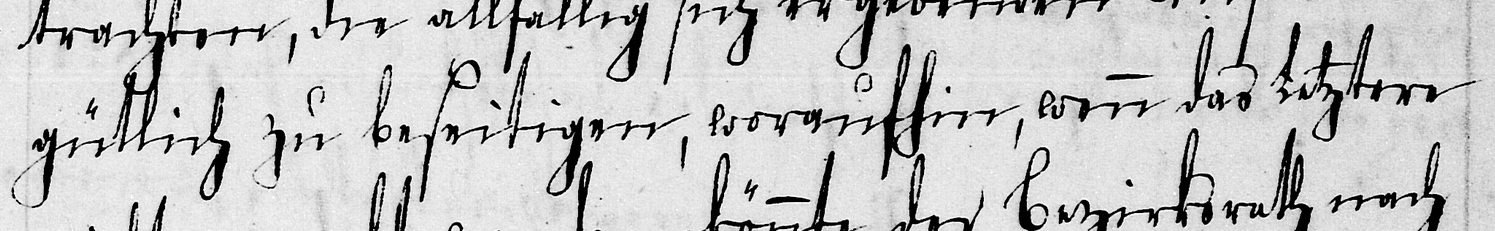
gütlich zu beseitigen, woraufhin, wenn das Letztere
